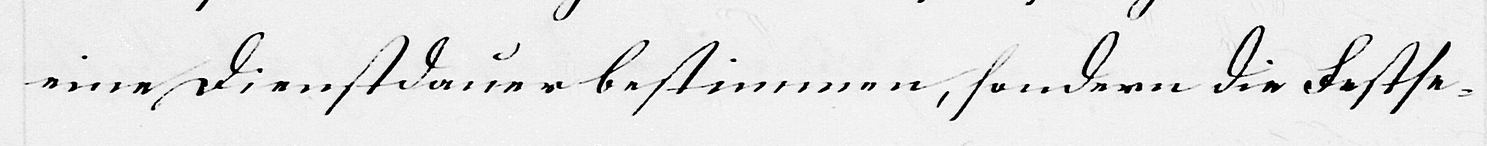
eine Dienstdauer bestimmen, sondern die Festse¬
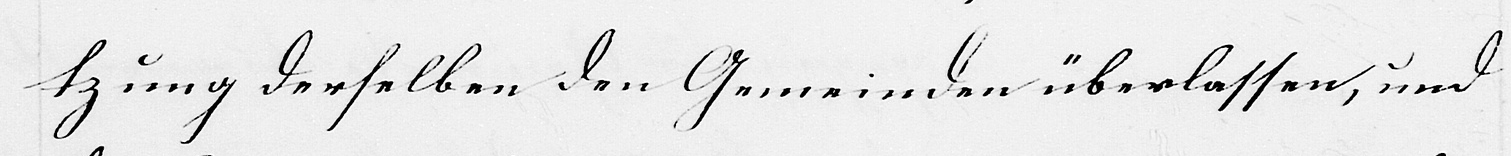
tzung derselben den Gemeinden überlassen, und
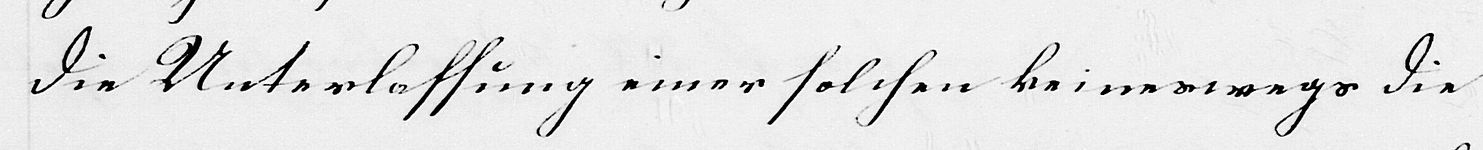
die Unterlassung einer solchen keineswegs die
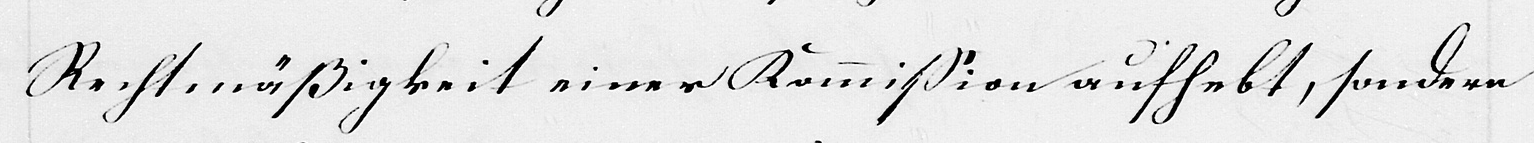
Rechtmäßigkeit einer Kommißion aufhebt, sondern
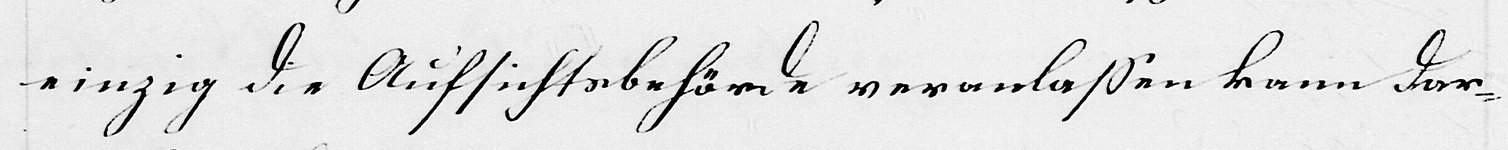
einzig die Aufsichtsbehörde veranlaßen kann dar¬
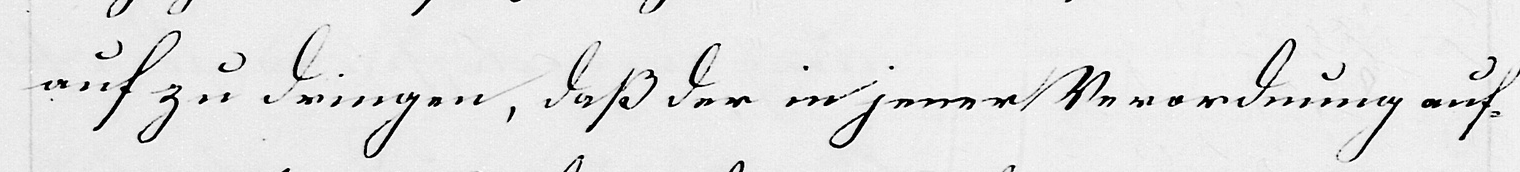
auf zu dringen, daß der in jener Verordnung auf¬
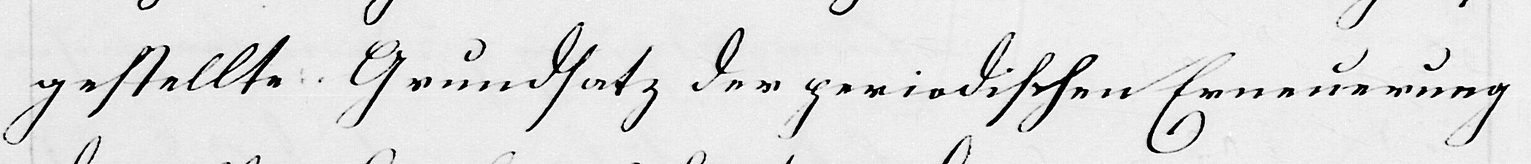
gestellte Grundsatz der periodischen Erneuerung
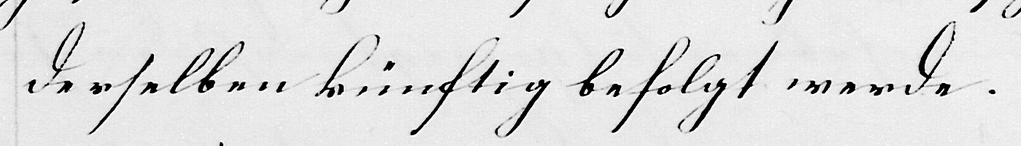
derselben künftig befolgt werde.
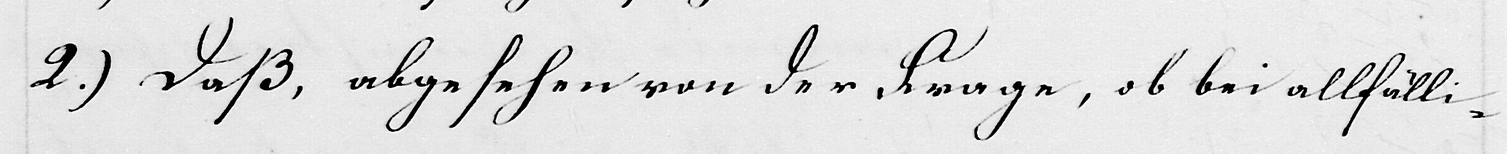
2.) Daß, abgesehen von der Frage, ob bei allfälli-
